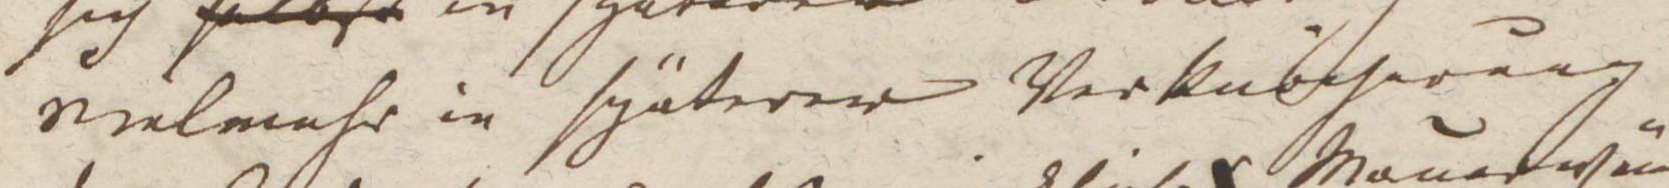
vielmehr in späterer Verknöcherung
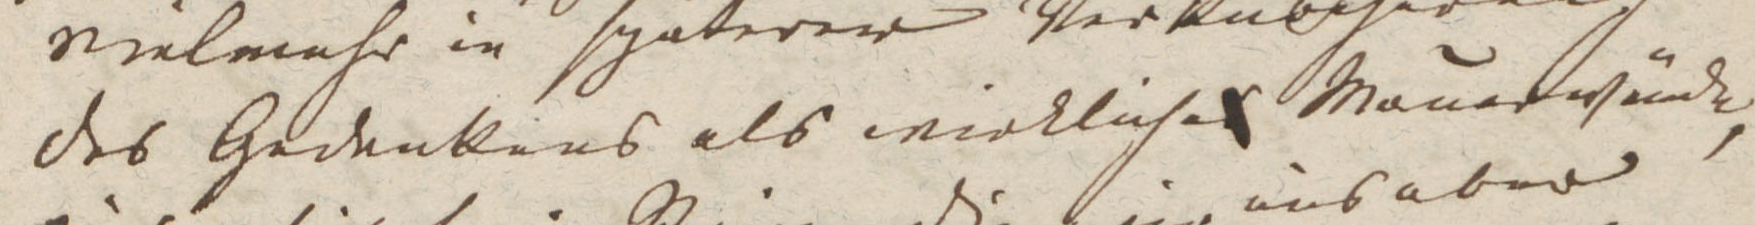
des Gedenkens als wirkliches Mauerwände,
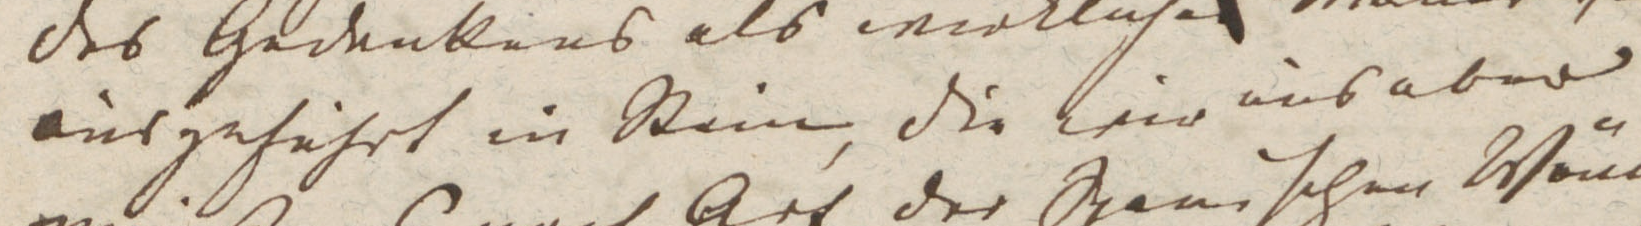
ausgeführt in Stein, die wir uns aber
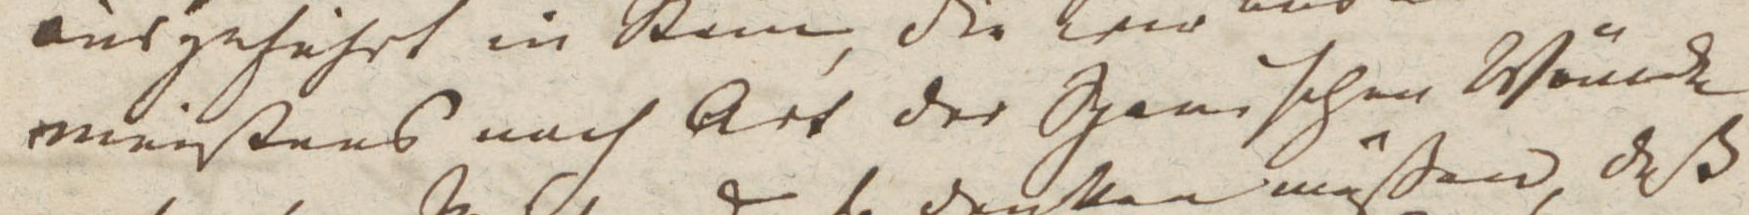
meistens nach Art der Spanischen Wände
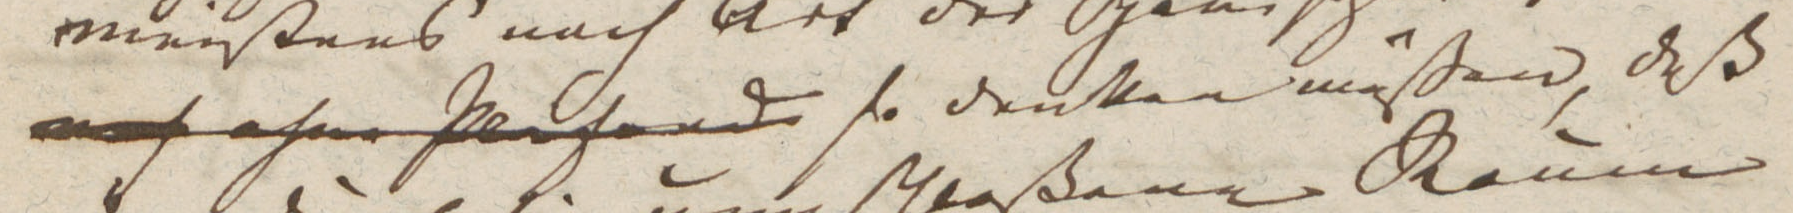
auch ohne Plafond so denken müssen, dass
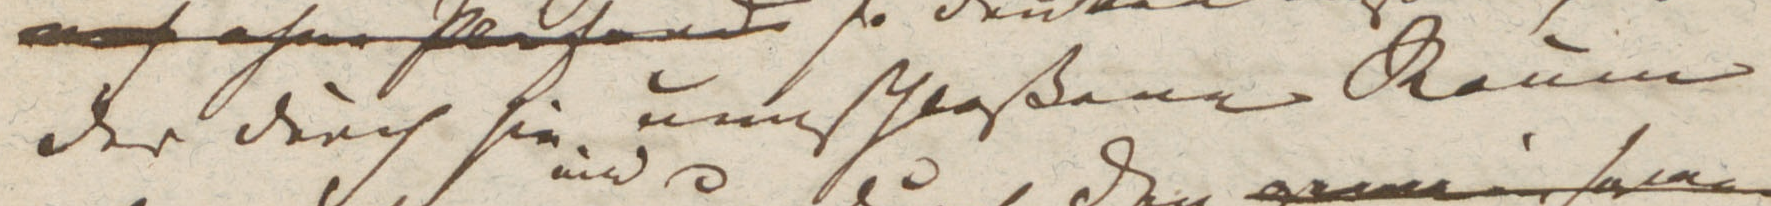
der durch sie umschlossene Raum
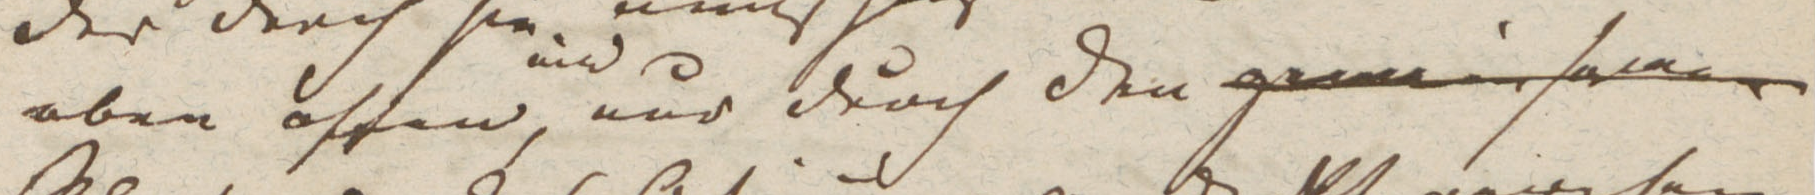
oben offen, und nur durch den gemeinsamen
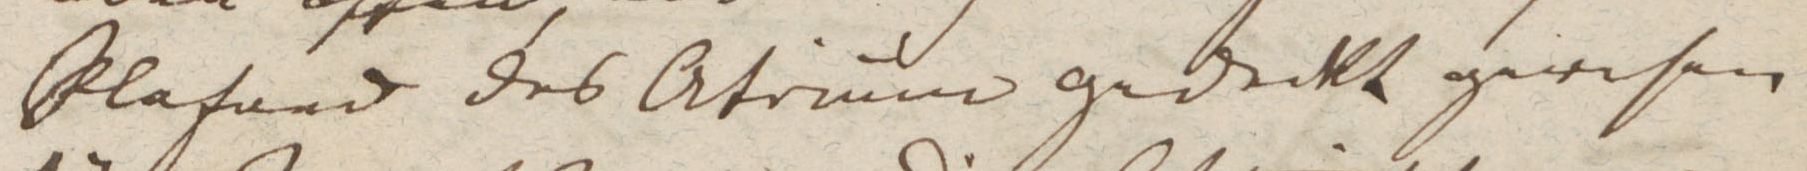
Plafond des Atrium gedeckt gewesen
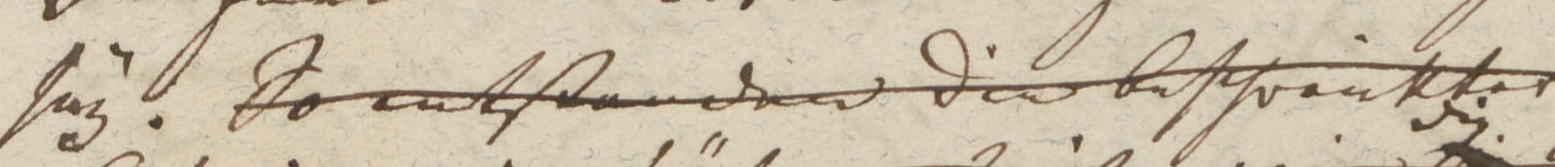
sey. So entstanden die beschränkteren
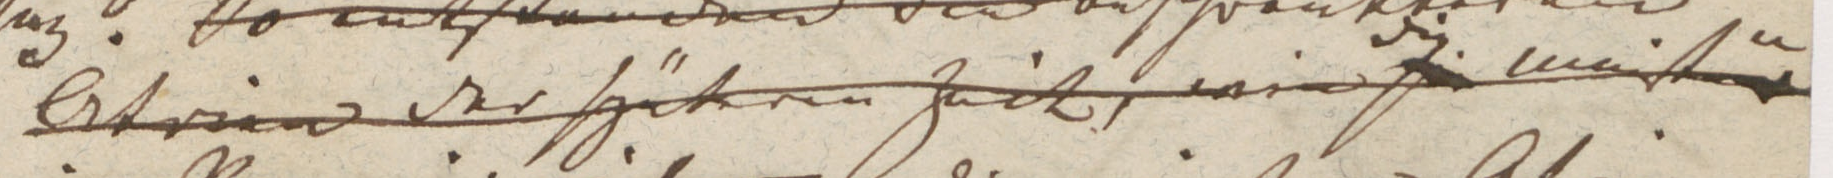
Atrien der späteren Zeit, wie sie die meistern
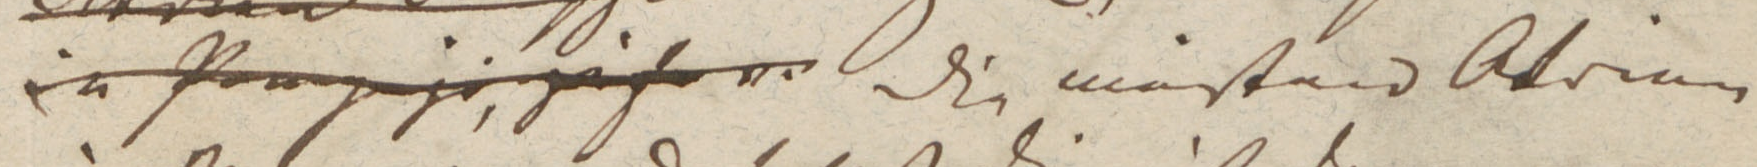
in Pompeji, zu f Die meisten Atrien
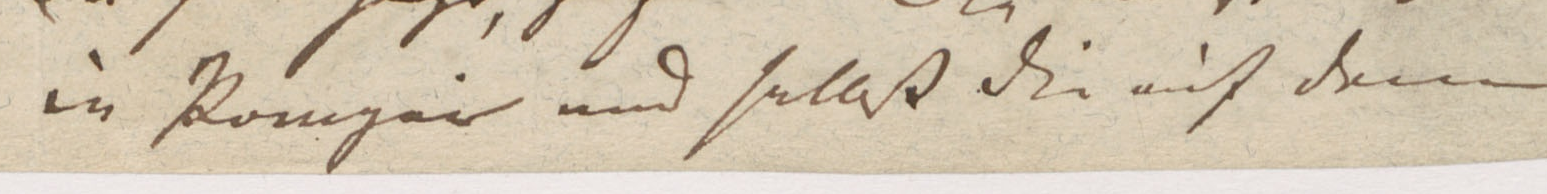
in Pompei und selbst die auf dem
